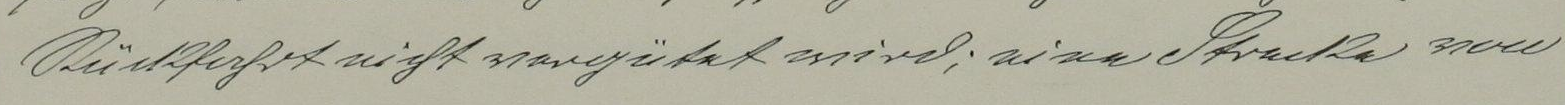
Rückfahrt nicht vergütet wird; eine Strecke von
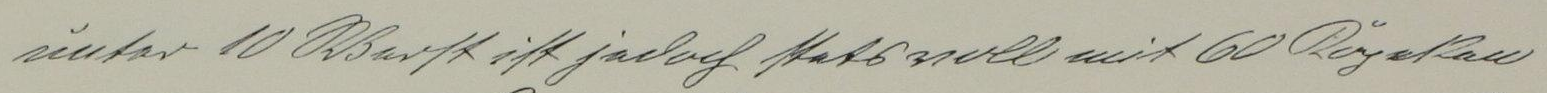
unter 10 Werst ist jedoch stets voll mit 60 Kopeken
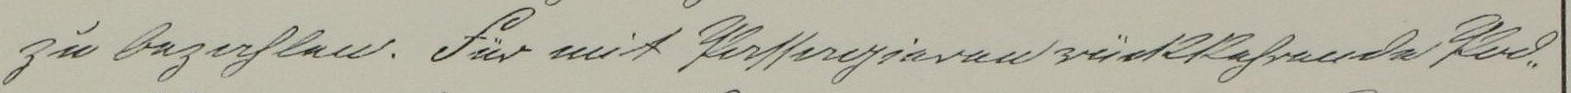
zu bezahlen. Für mit Passagieren rückkehrende Pod-
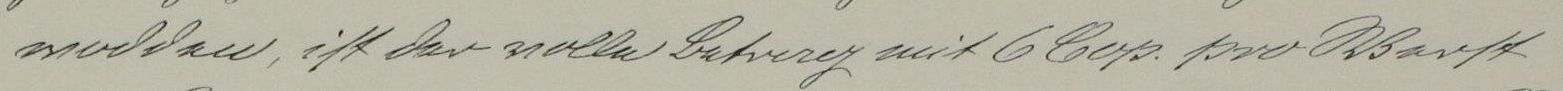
wodden, ist der volle Betrag mit 6 Cop. pro Werst
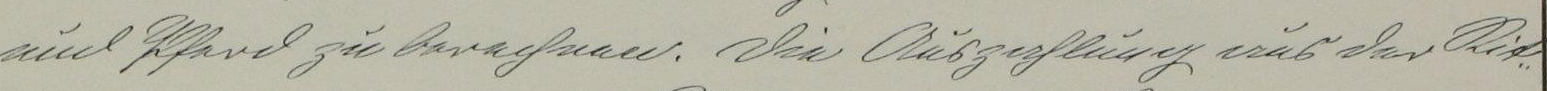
und Pferd zu berechnen. Die Auszahlung aus der Rit-
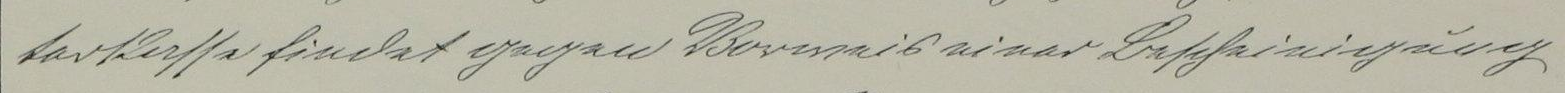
terkasse findet gegen Vorweis einer Bescheinigung
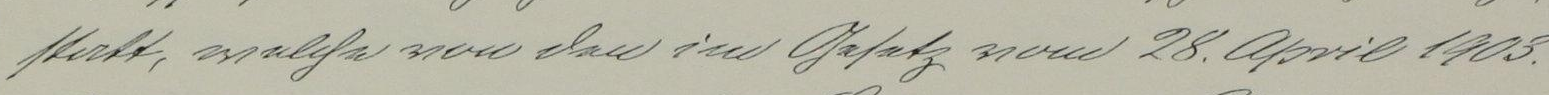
statt, welche von den im Gesetz vom 28. April 1903.
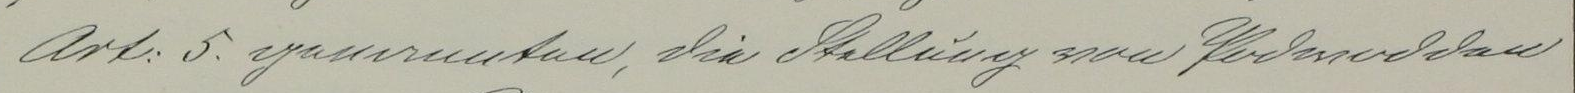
Art. 5. genannten, die Stellung von Podwodden
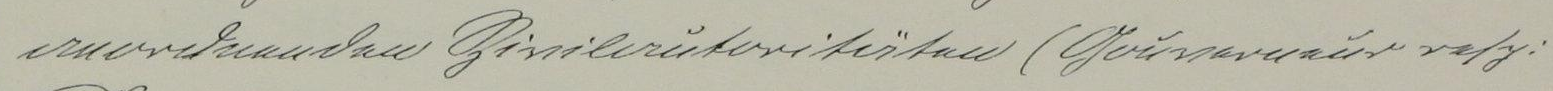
anordnenden Zivilautoritäten (Gouverneur resp.
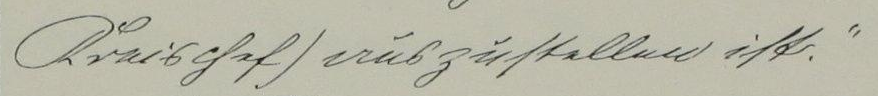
Kreischef) auszustellen ist.“
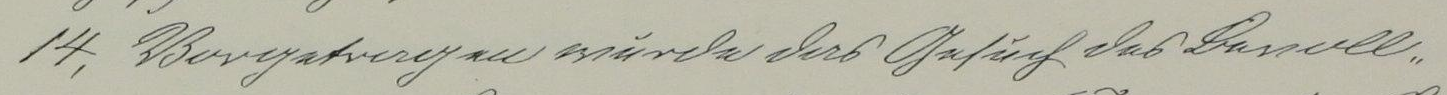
14. Vorgetragen wurde das Gesuch des Bevoll-
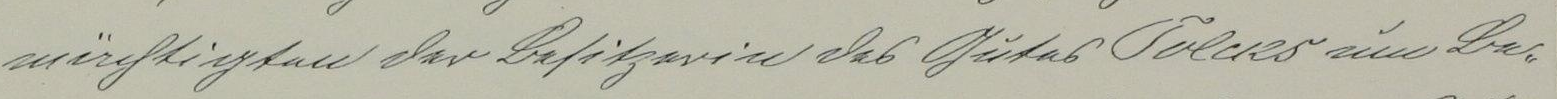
mächtigten der Besitzerin des Gutes Tolcks um Be-
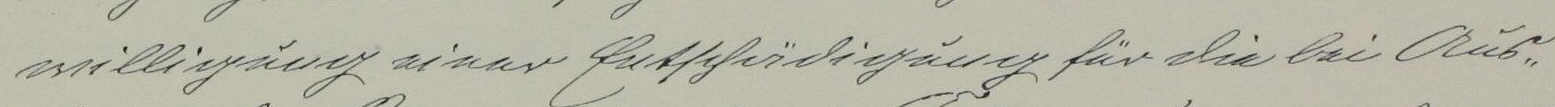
willigung einer Entschädigung für die bei Aus-
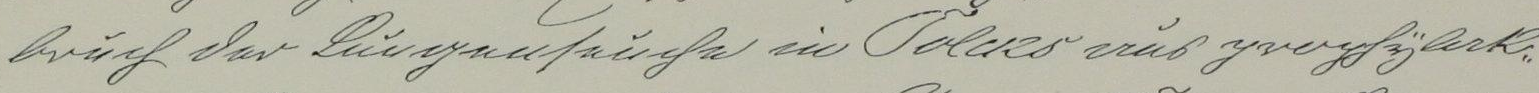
bruch der Lungenseuche in Tolcks aus prophylak-
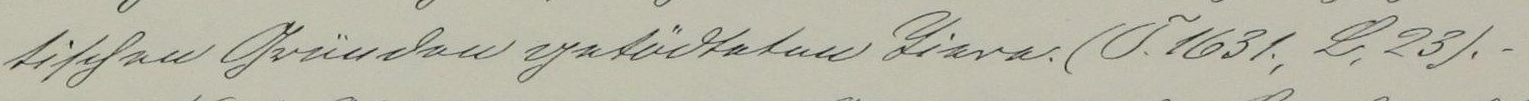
tischen Gründen getödteten Tiere. (T.1631; L.23).
